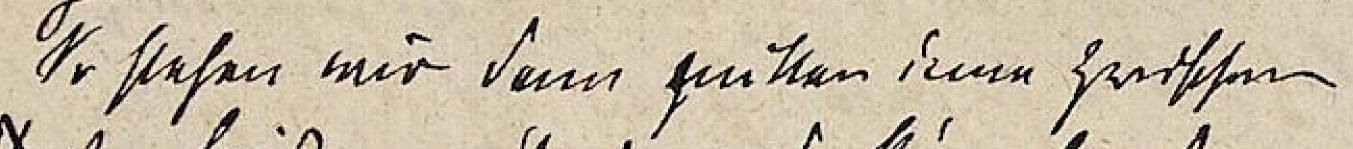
So stehen wir dem mitten inne Zischen
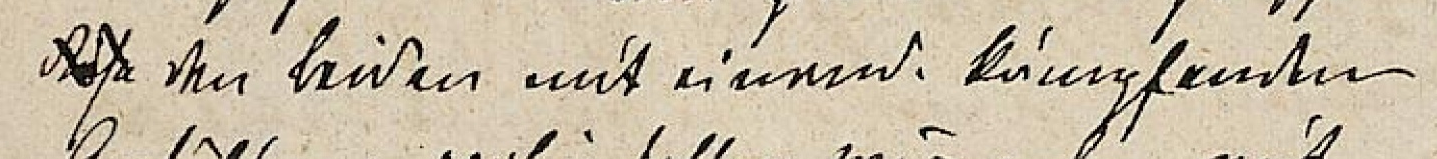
dies den beiden miteinand. kämpfenden
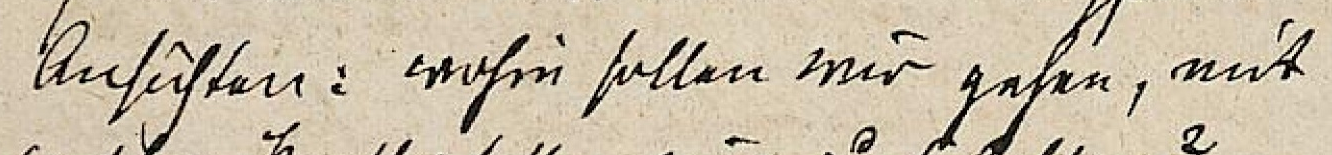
Ansichten: wohin sollen wir gehen, mit
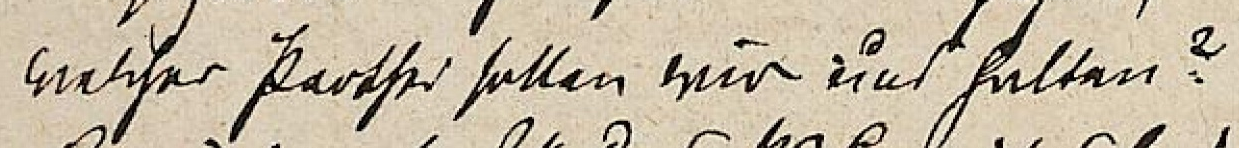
welcher Parthei sollen wir uns halten?
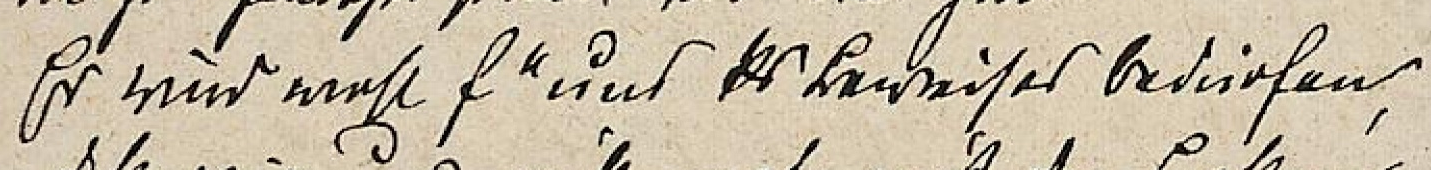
Es wird wohl fü uns ks Beweises bedürfen,
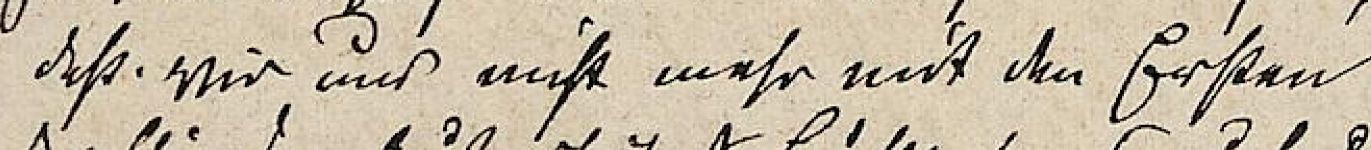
daß. wir uns nicht mehr mit den Ersten
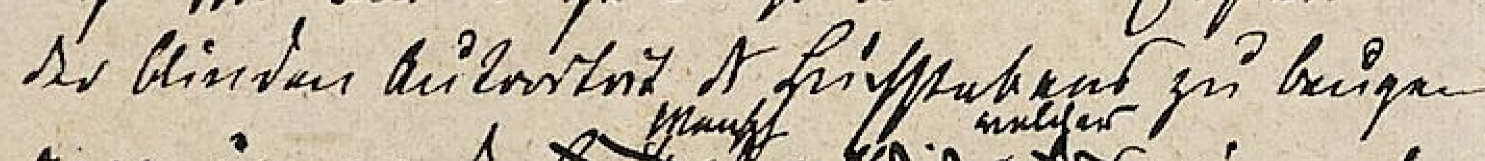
der blinden Autorität ds Buchstabens zu beugen
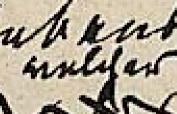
welcher
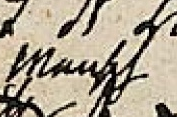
Mensch
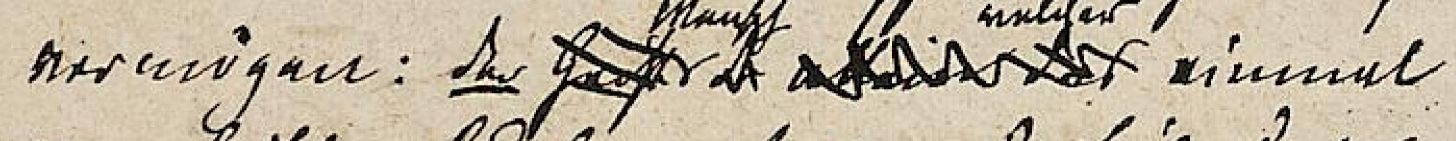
vermögen: der Geist dr allein dies eimmal
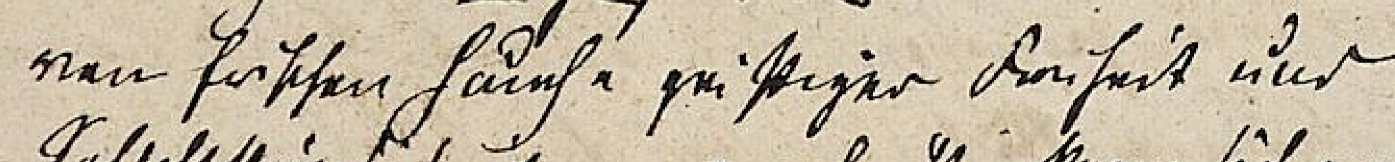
von frischen Hauche geistiger Freiheit und
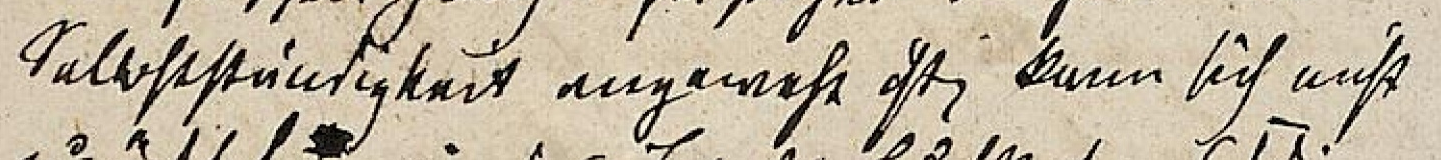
Selbstständigkeit angeweht ist, kann sich nicht
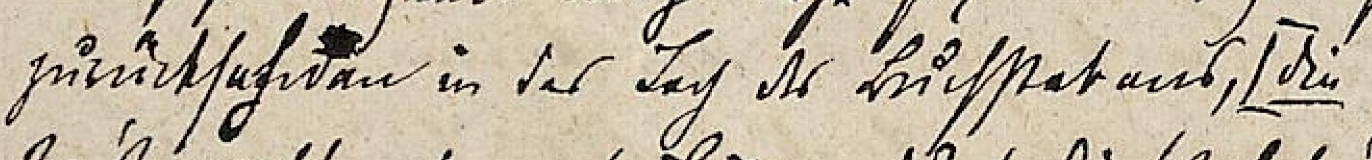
zurücksehnen in das Joch des Buchstabens, [die
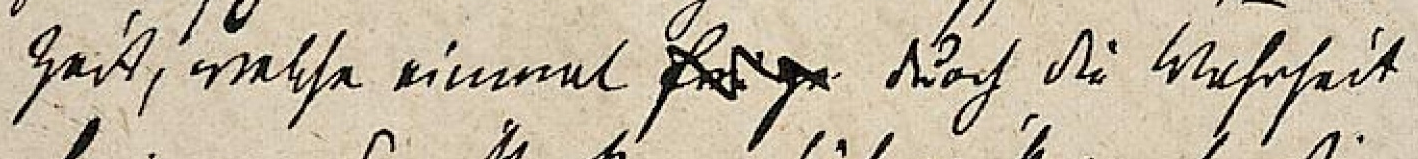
Zeit, welche einmal freige durch die Wahrheit
